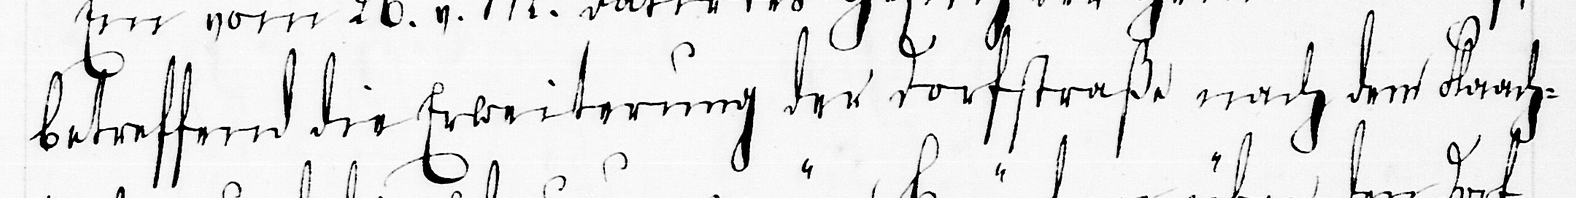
betreffend die Erweiterung der Dorfstraße nach dem Flaach¬
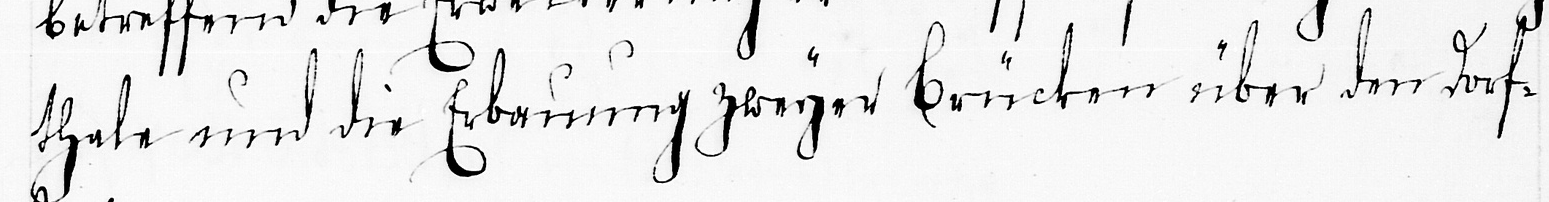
thale und die Erbauung zweyer Brücken über den Dorf¬
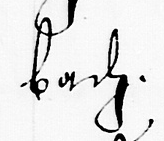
bach.
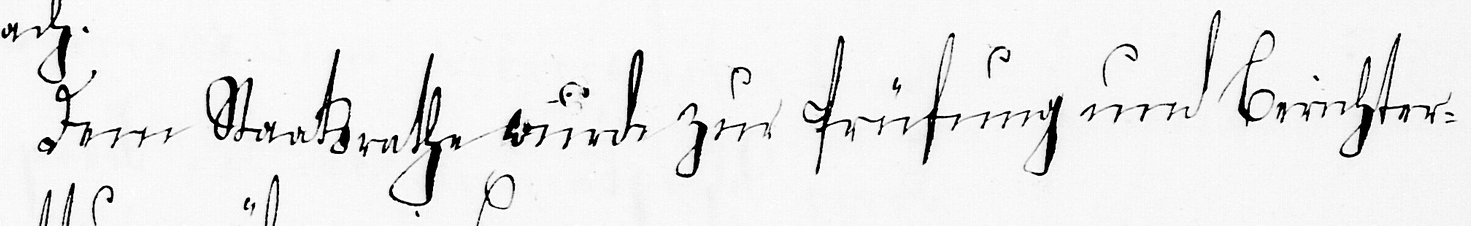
Dem Staatsrathe wurde zur Prüfung und Berichters¬
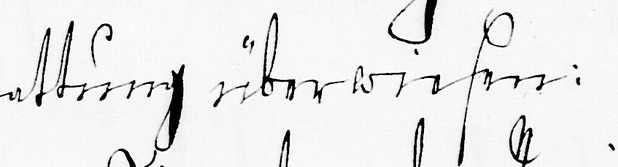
ttung überwiesen:
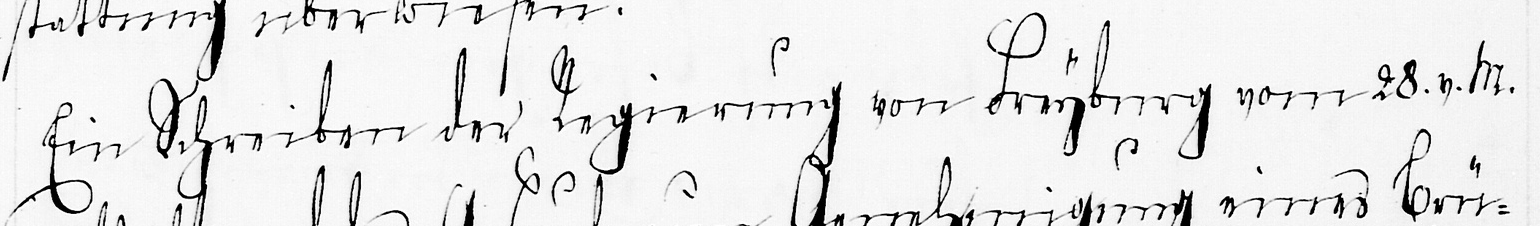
Ein Schreiben der Regierung von Freyburg vom 28. v. M.
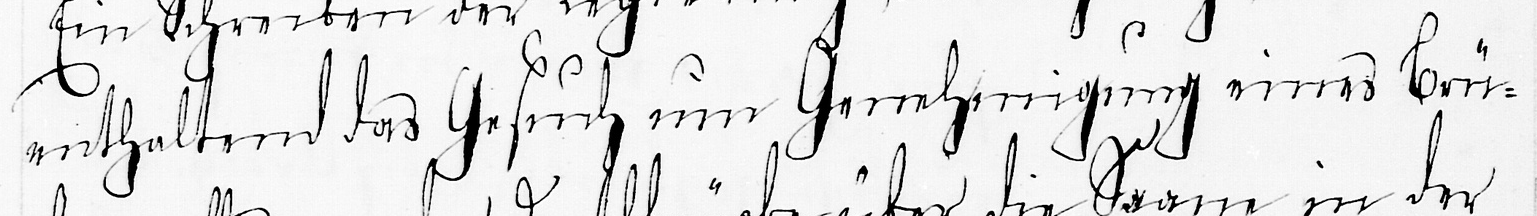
enthaltend das Gesuch um Genehmigung eines Brü¬
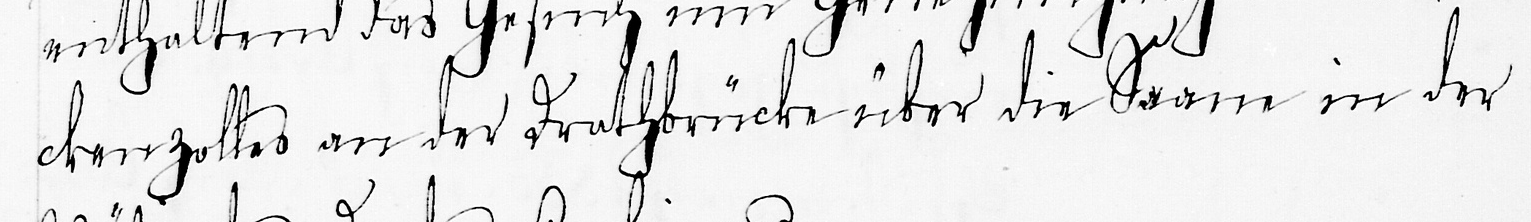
ckenzolles an der Drathbrücke über die Saane in der
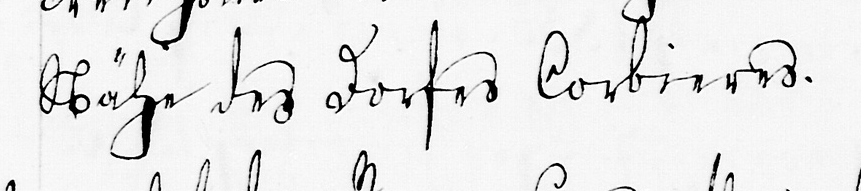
Nähe des Dorfes Corbieres.
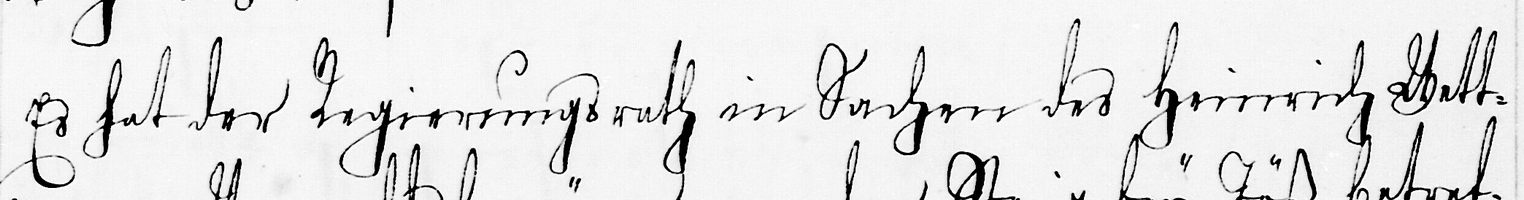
Es hat der Regierungsrath in Sachen des Heinrich Wett¬
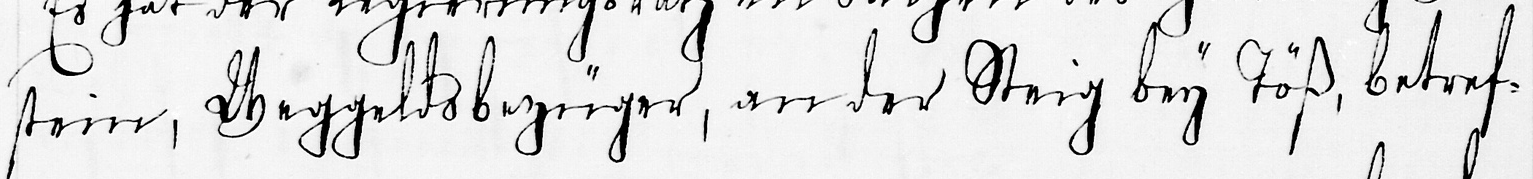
stein, Weggeldbezüger, an der Steig bey Töß, betref-
